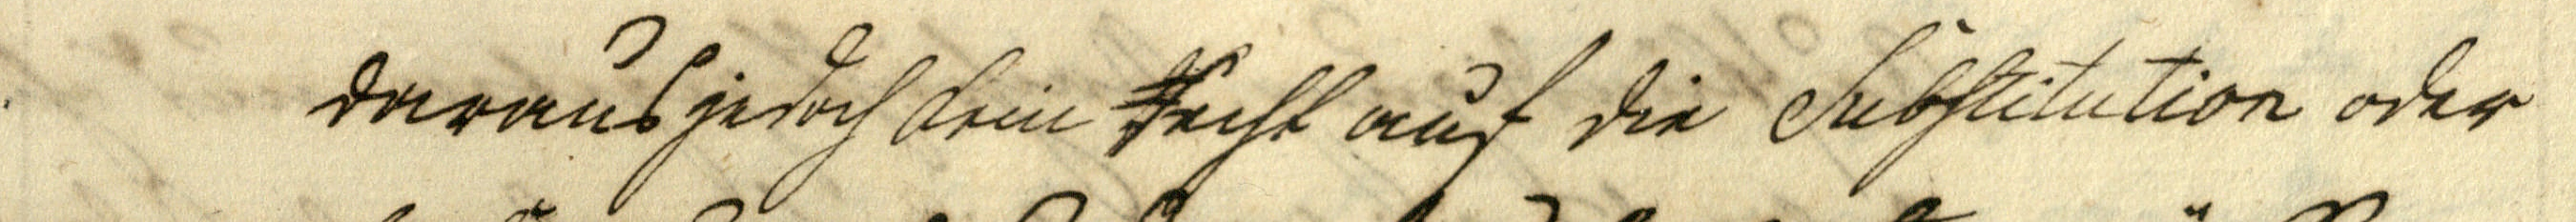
daraus jedoch kein Recht auf die Substitution oder
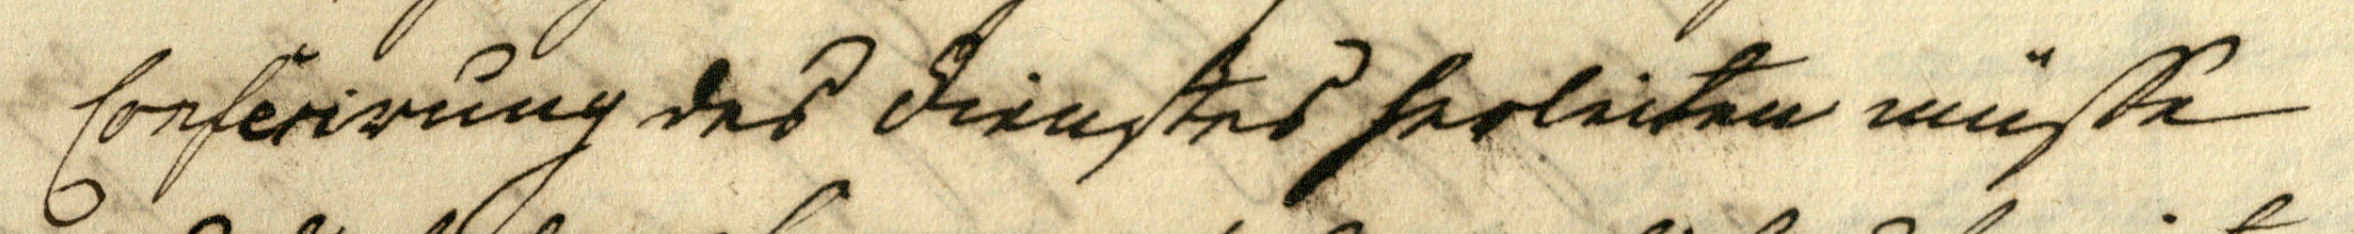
Conferirung des Dienstes herleiten müsse
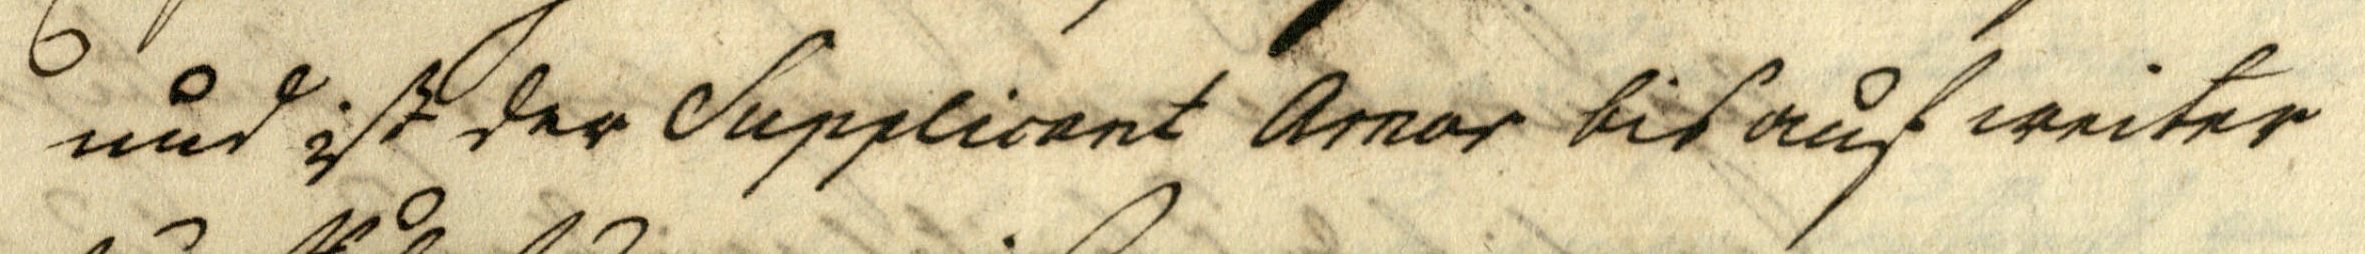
und ist der Supplicant Amor bis auf weiter
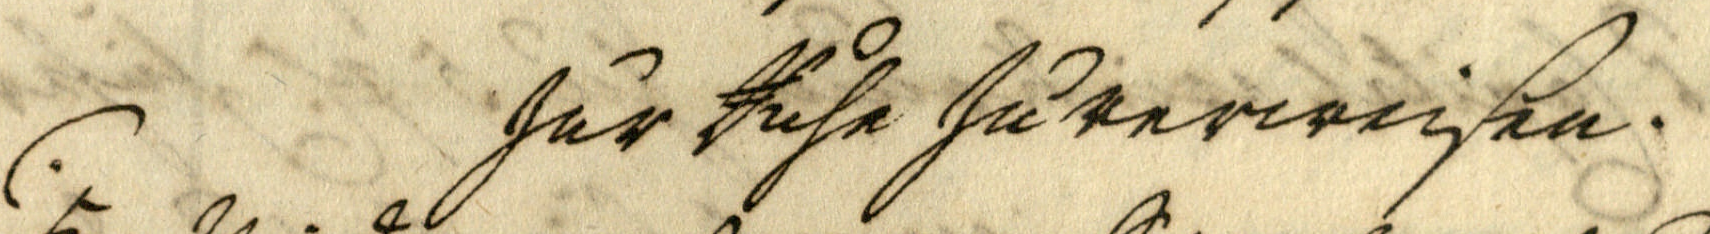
zur Ruhe zu verweisen.
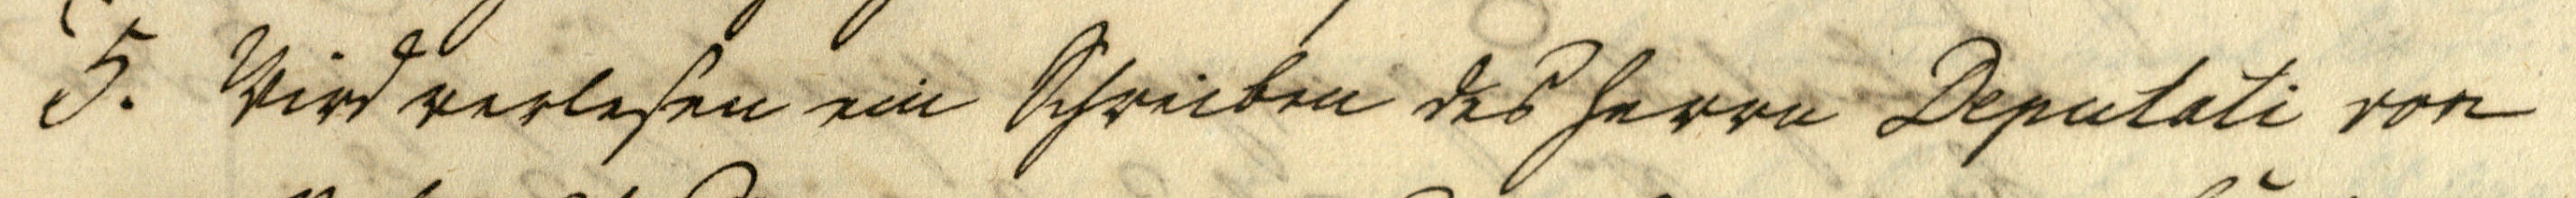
5. Wird verlesen ein Schreiben des Herrn Deputati von
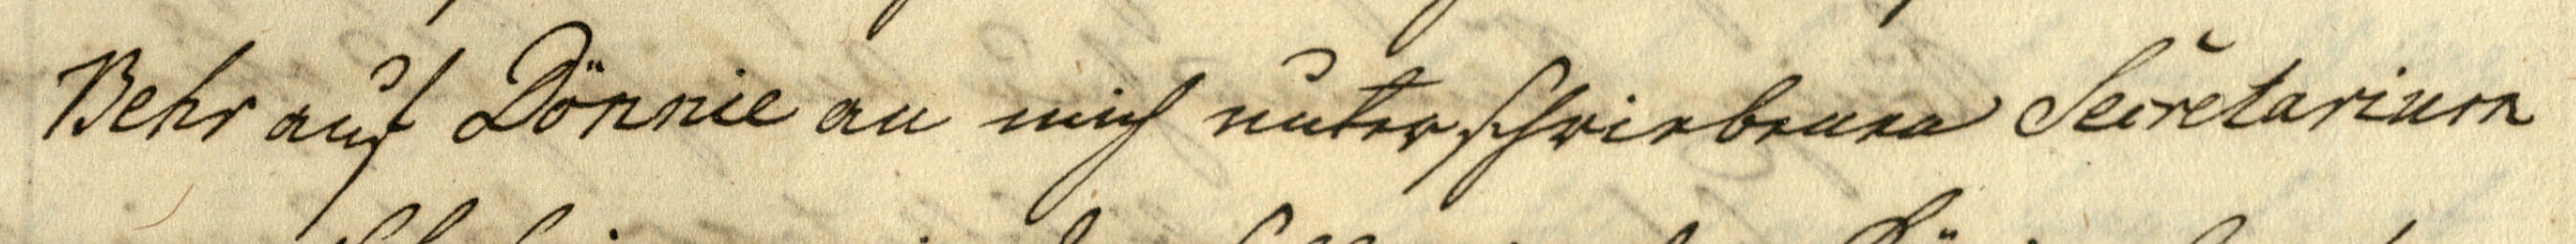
Behr auf Dönnie an mich unterschriebenen Secretarium
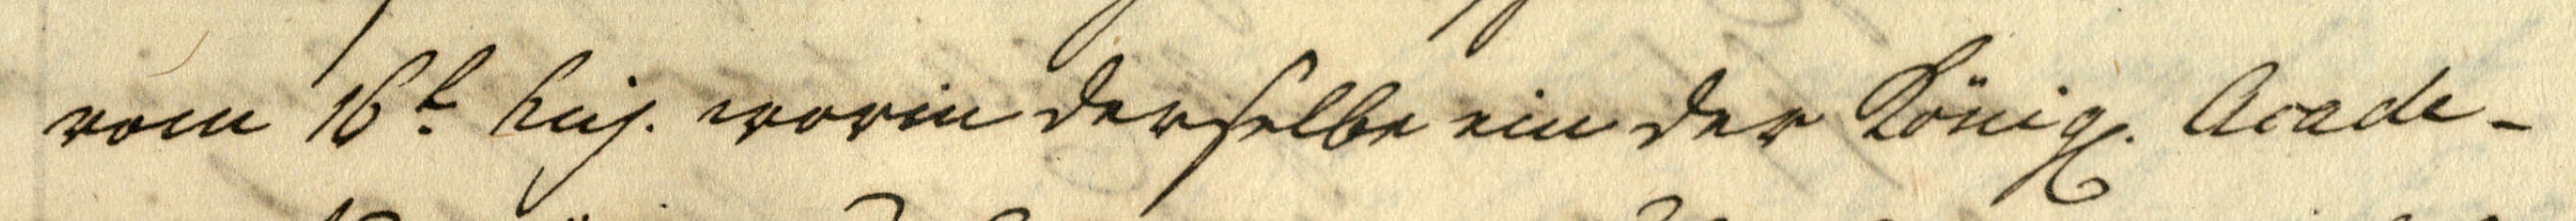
vom 16ten huj. worin derselbe ein der Königl. Acade-
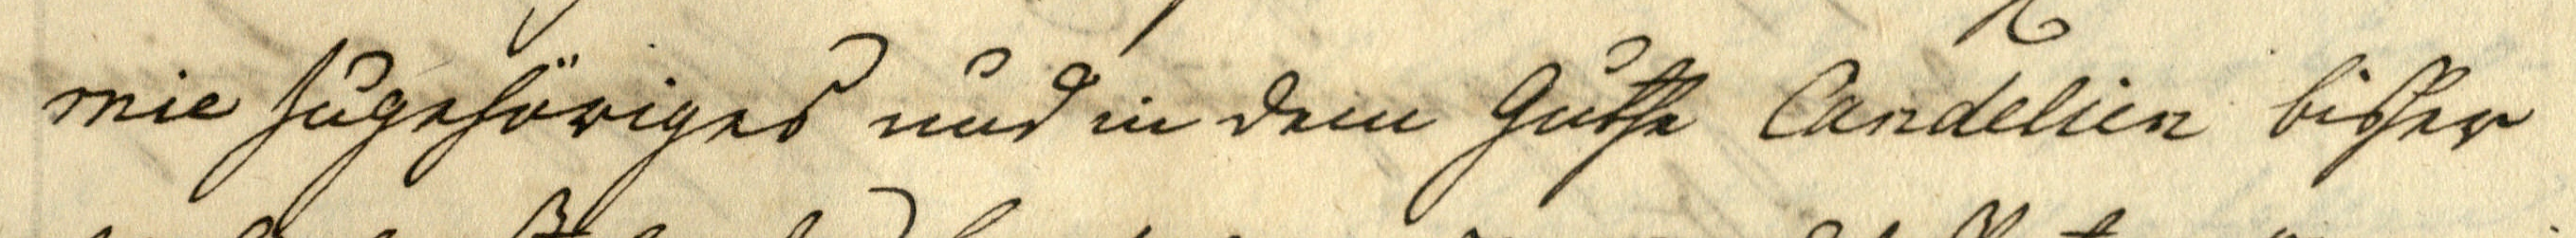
mie zugehöriges und in dem Guthe Candelien bisher
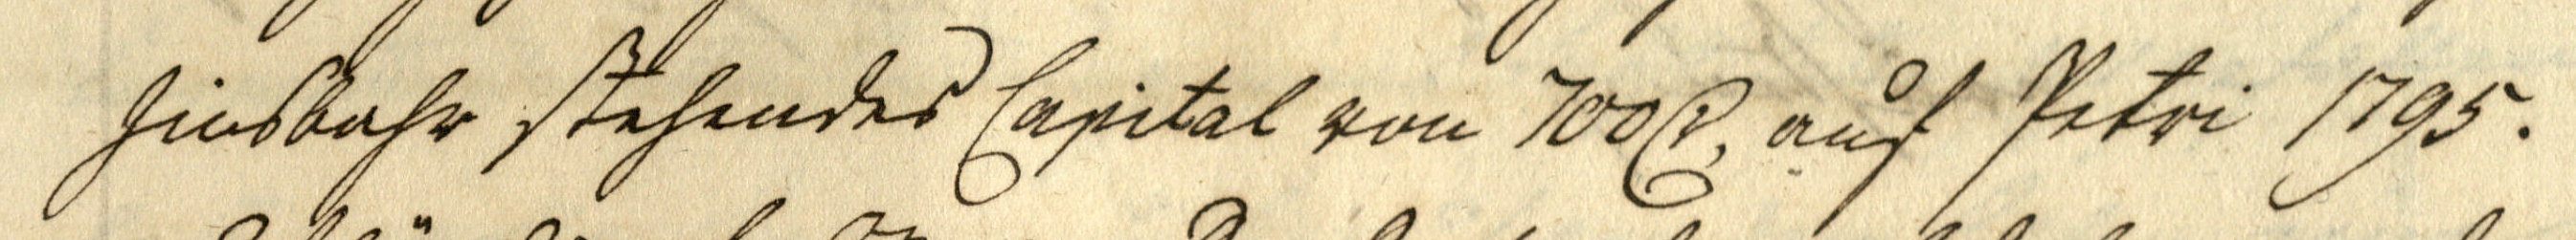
zinsbahr stehendes Capital von 700 rtl auf Petri 1795.
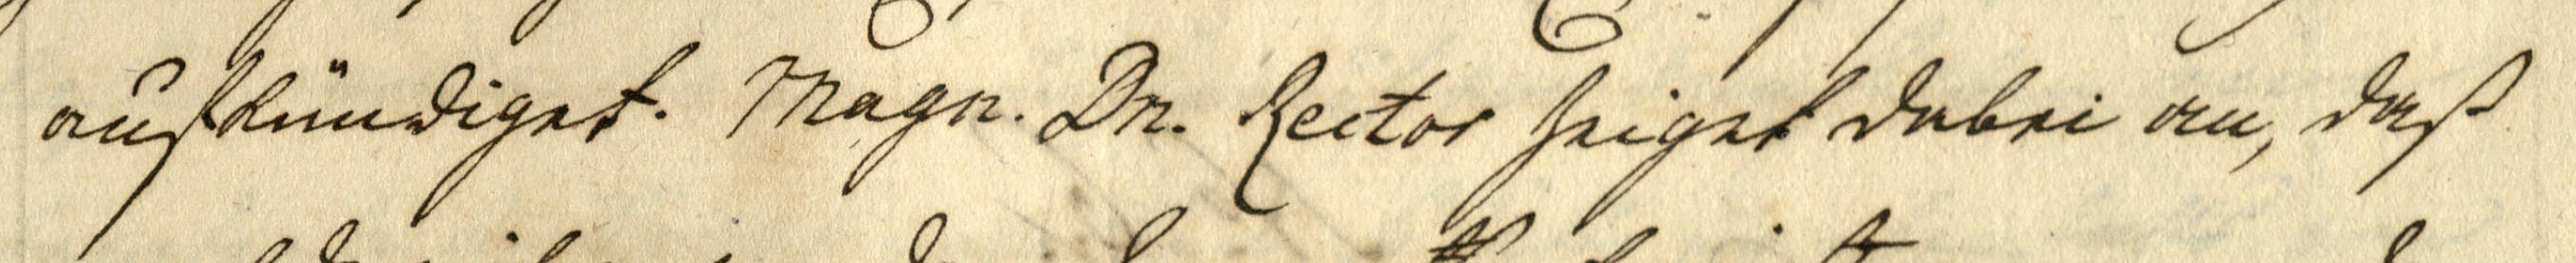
aufkündiget. Magn. Dn. Rector zeiget dabei an, daß
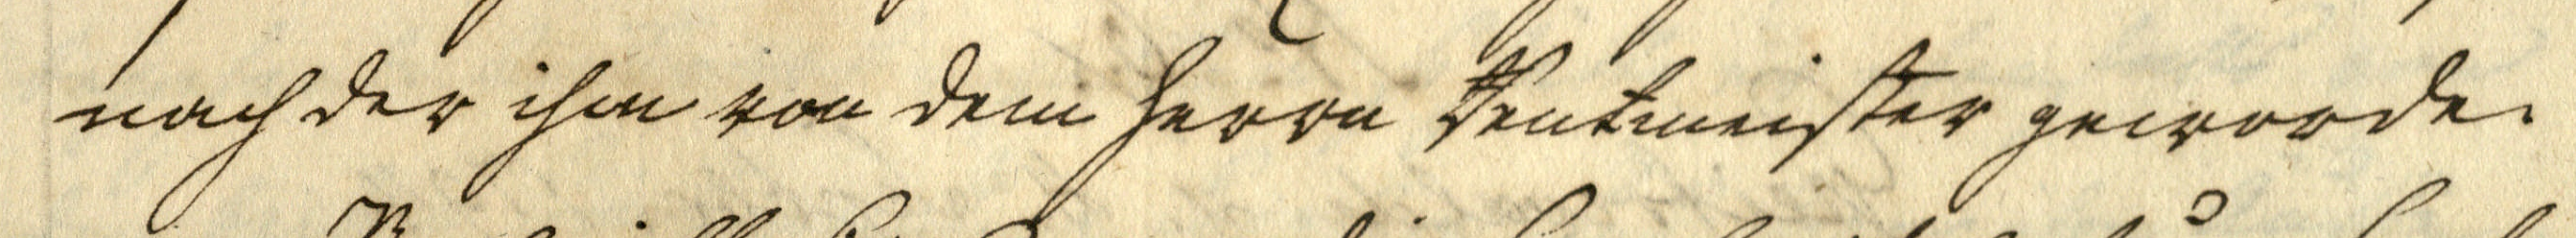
nach der ihm von dem Herrn Rentmeister geworde-
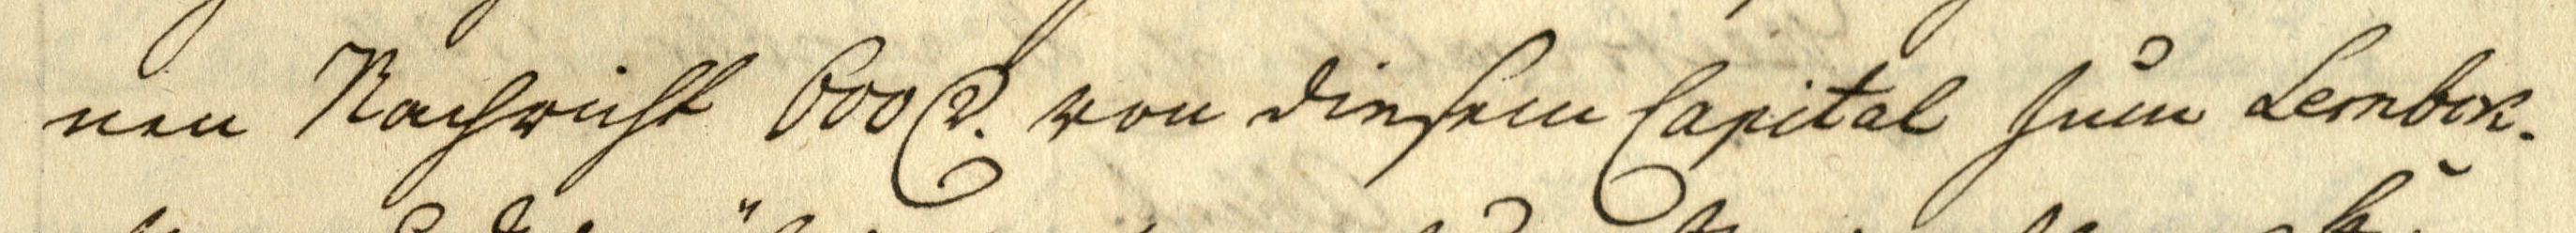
nen Nachricht 600 rtl von diesem Capital zum Lembck-
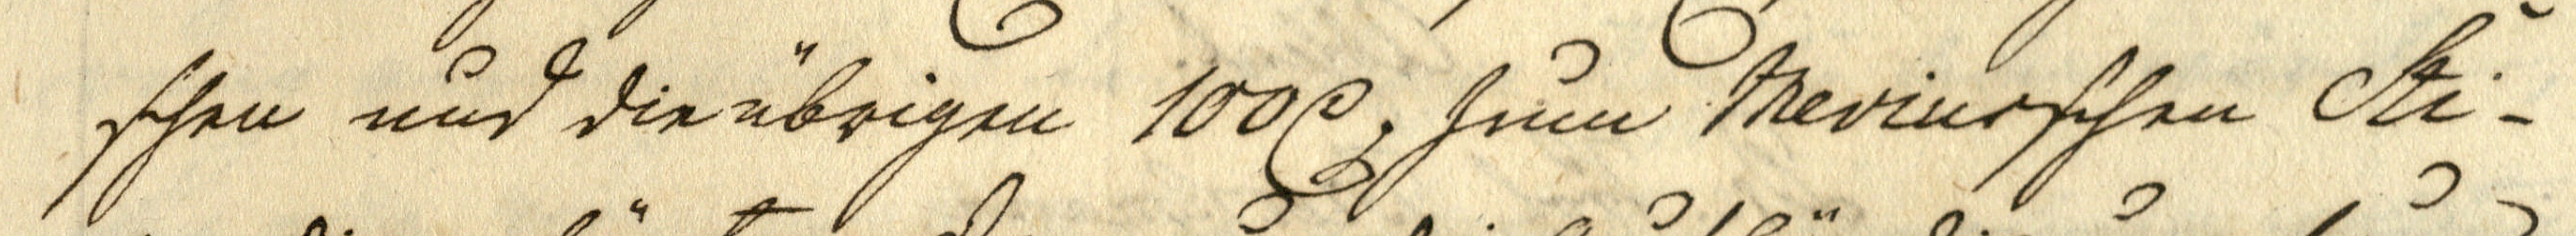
schen und die übrigen 100 rtl zum Meviusschen Sti-
